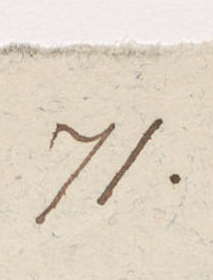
71.
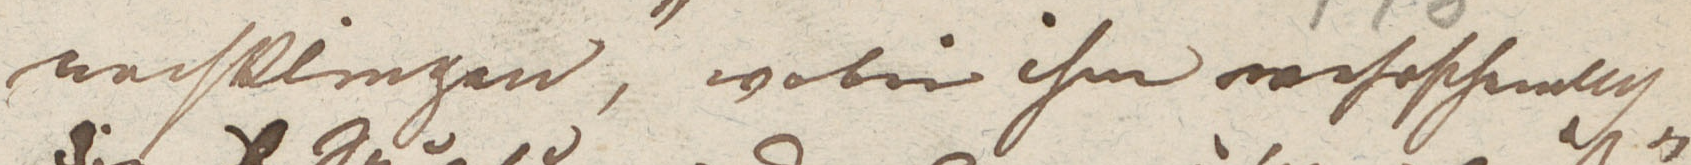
"nachklingen," wobei ihm wahrscheinlich
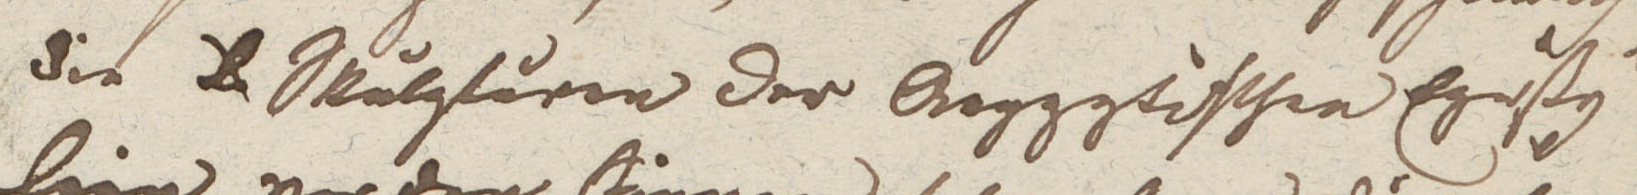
die l Skulpturen der Aegyptischen Episty
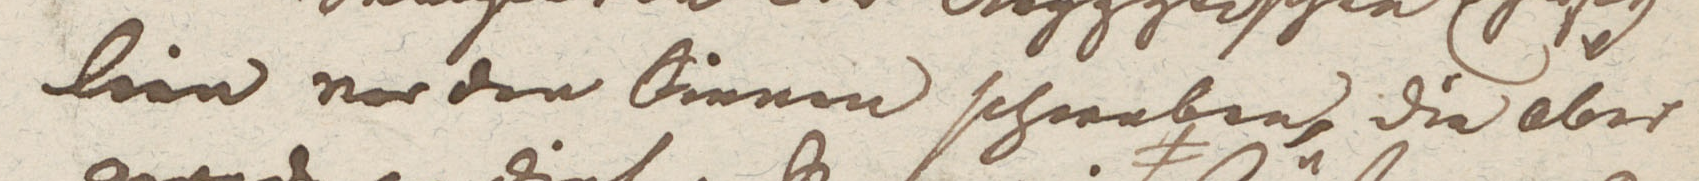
lien vor den Sinnen schweben, die aber
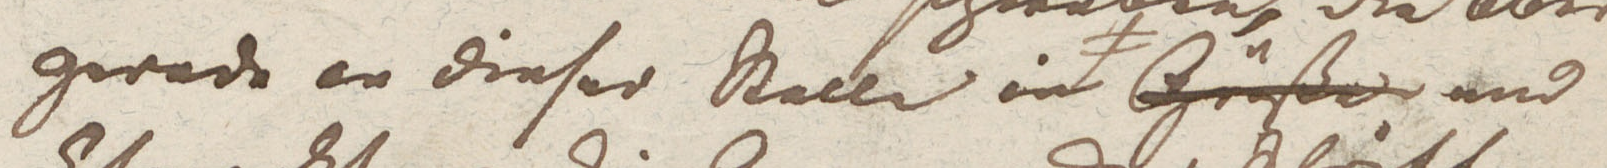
gerade an dieser Stelle in % Grösse und
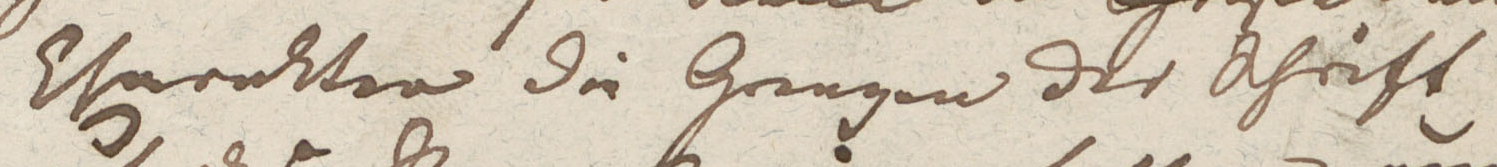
Charakter die Grenzen der Schrift
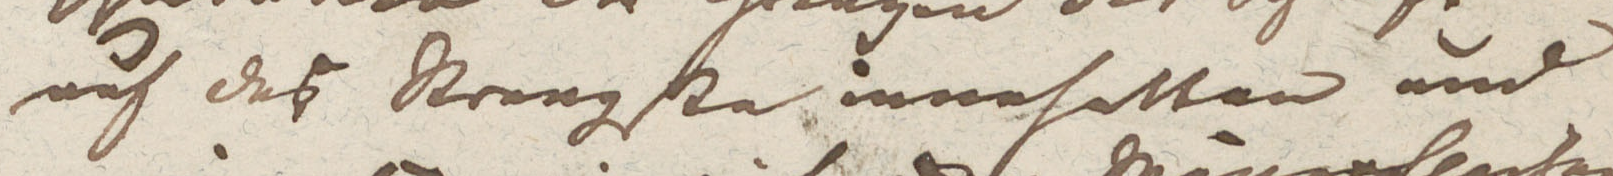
auf das Strengste innehalten und
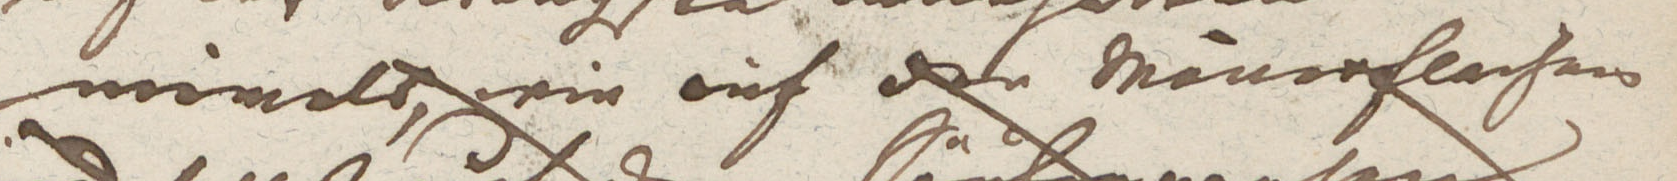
niemals, wie auf den Mauerflächen
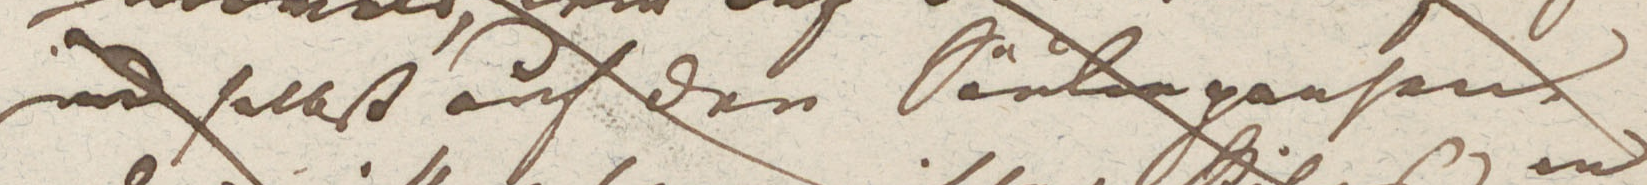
und selbst auf den Säulenpansen,
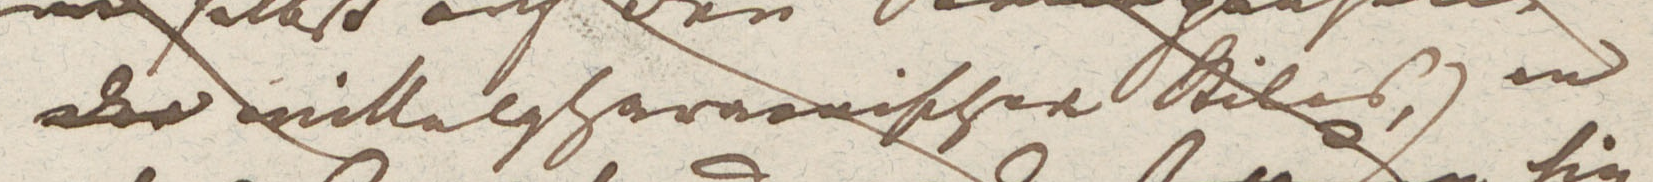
der mittelpharaonischen Stiles,) in
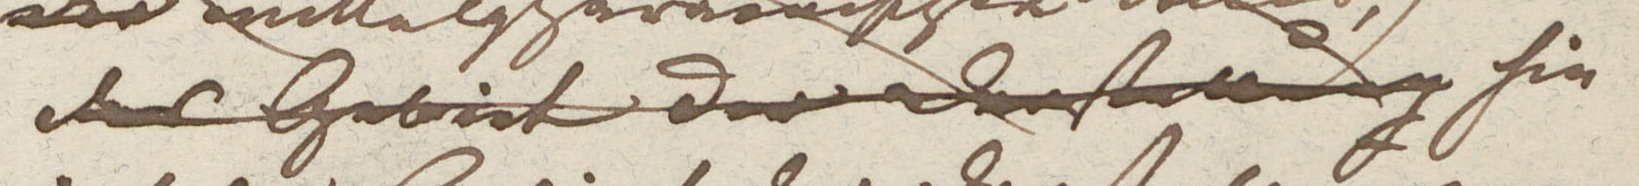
das Gebiet der Darstellung sie
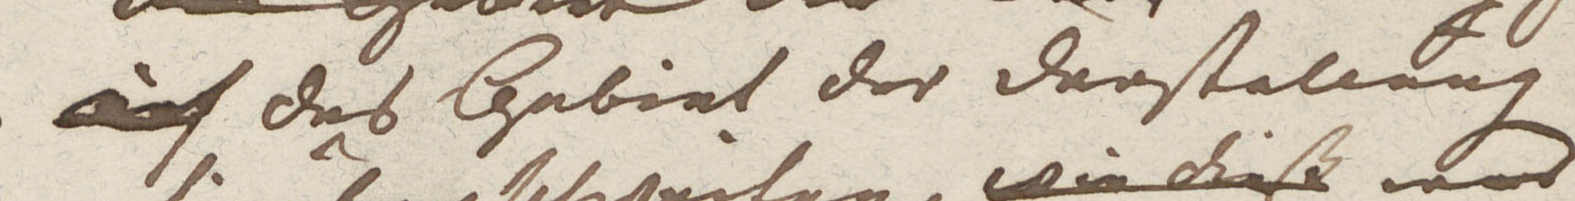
in auf das Gebiet der Darstellung
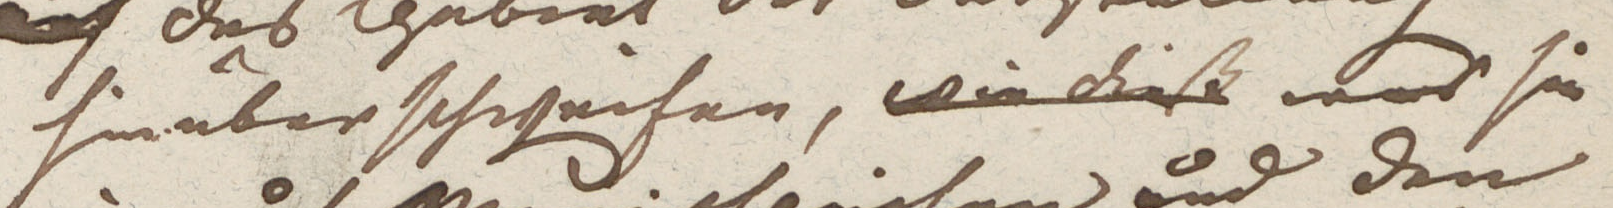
hinüberschweifen, wie diess was sie
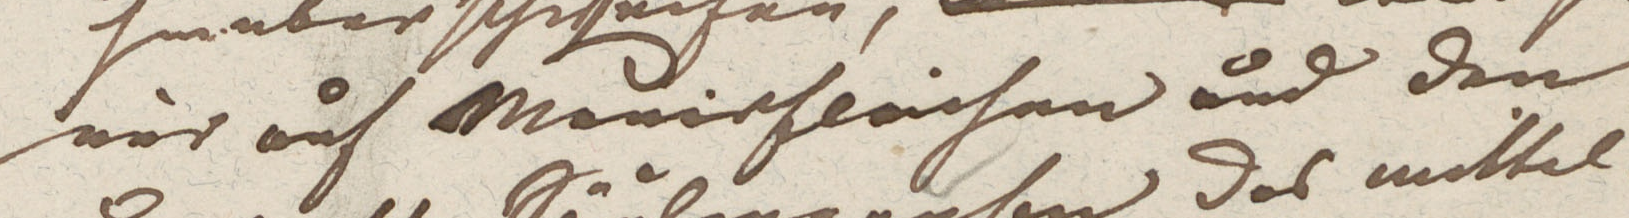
nur auf Mauerflächen und den
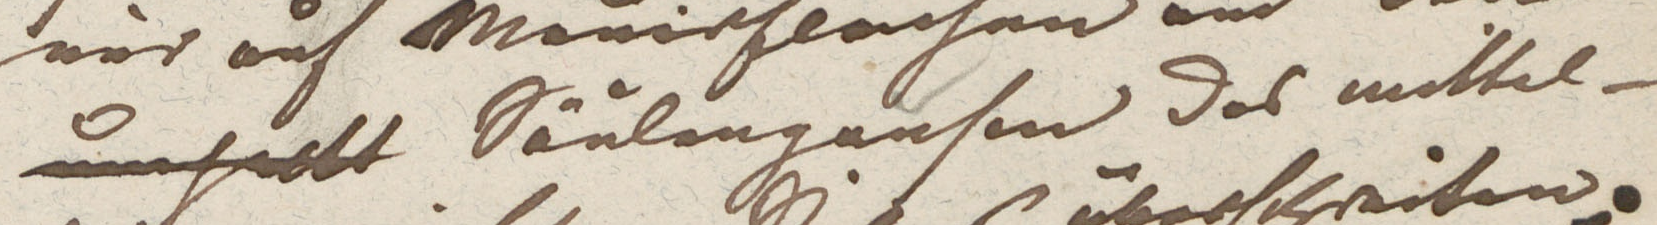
umhullt Säulenpansen des mittel-
